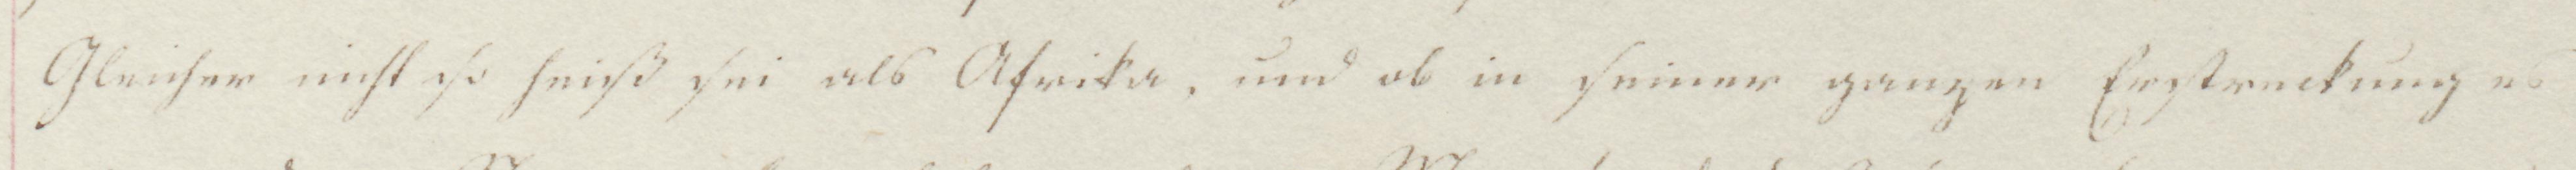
Gleicher nicht so heiß sei als Afrika, und ob in seiner ganzen Erstreckung es
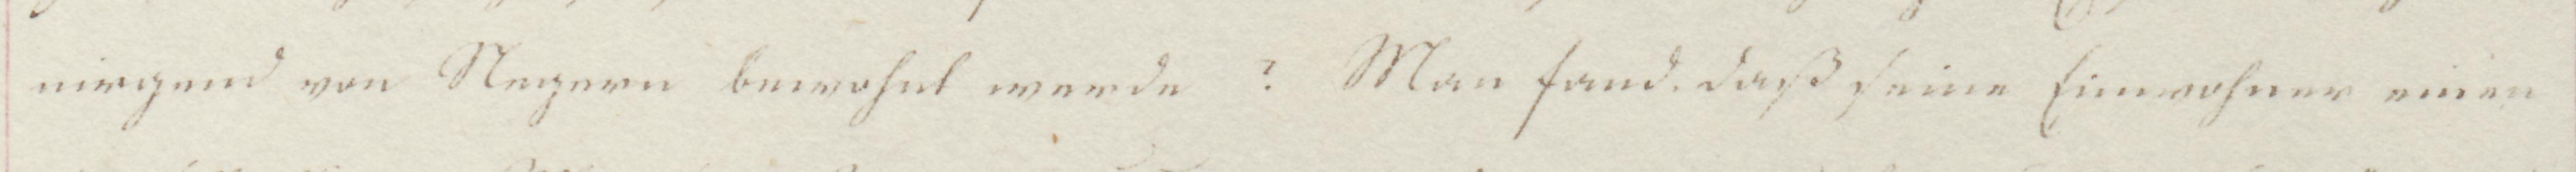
nirgend von Negern bewohnt werde? Man fand, daß seine Einwohner einen
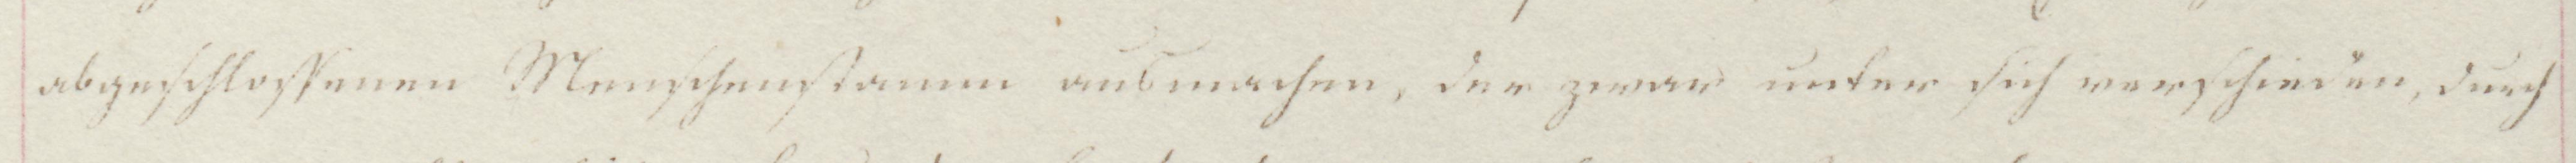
abgeschlossenen Menschenstamm ausmachen, der zwar unter sich verschieden, durch
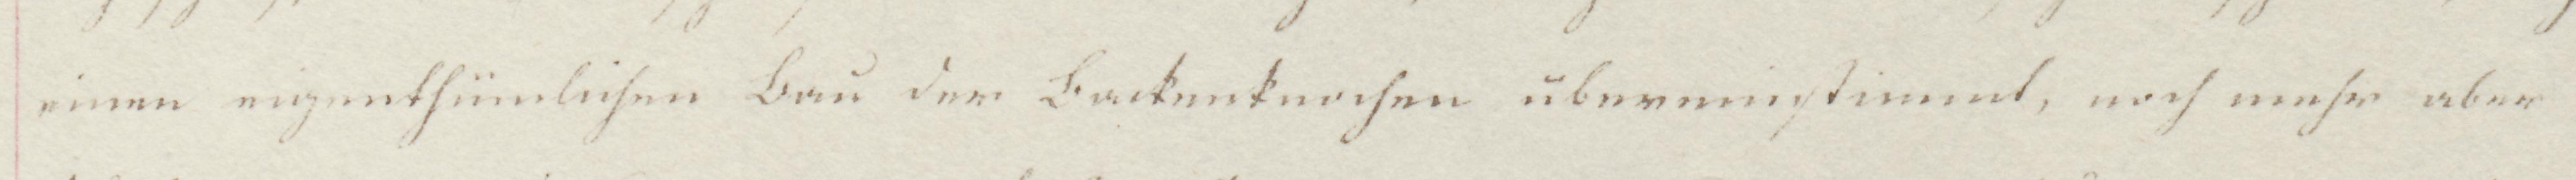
einen eigenthümlichen Bau der Backenknochen übereinstimmt, noch mehr aber
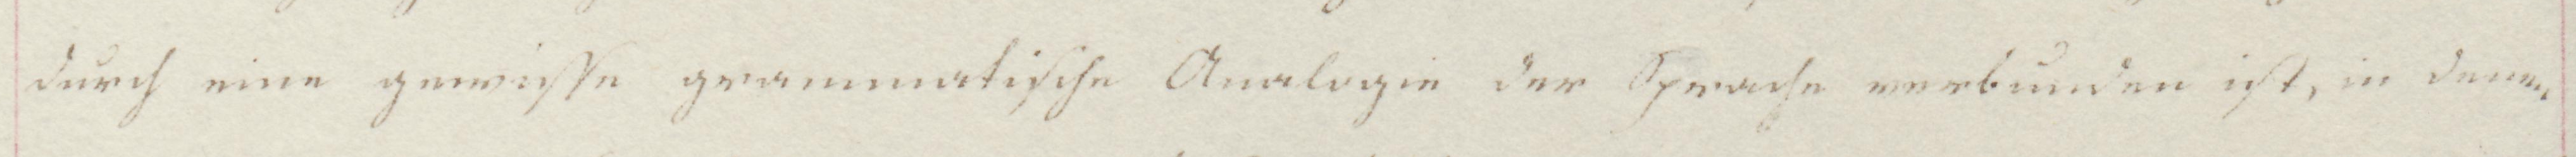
durch eine gewisse grammatische Analogie der Sprache verbunden ist, in denen
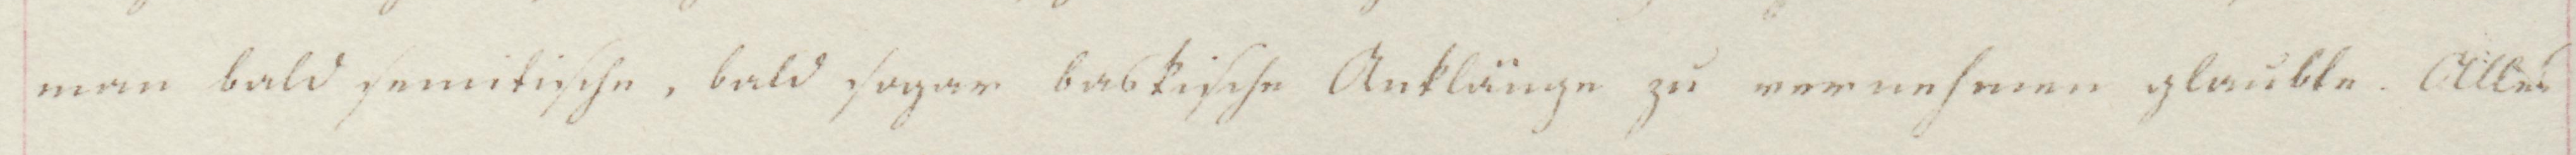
man bald semitische, bald sogar baskische Anklänge zu vernehmen glaubte. Alles
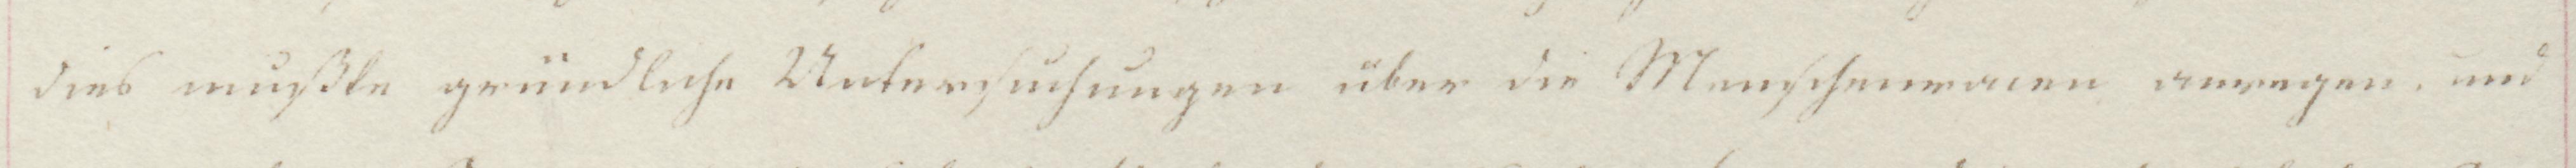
dies mußte gründliche Untersuchungen über die Menschenracen anregen, und
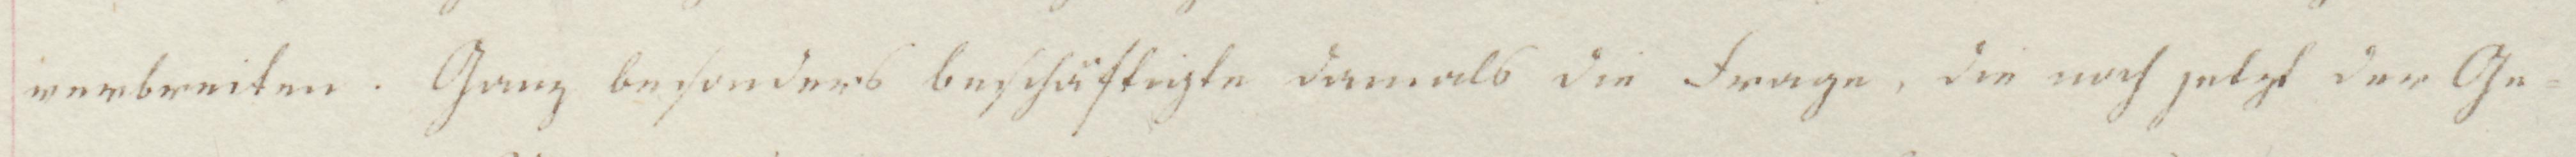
verbreiten. Ganz besonders beschäftigte damals die Frage, die noch jetzt der Ge-
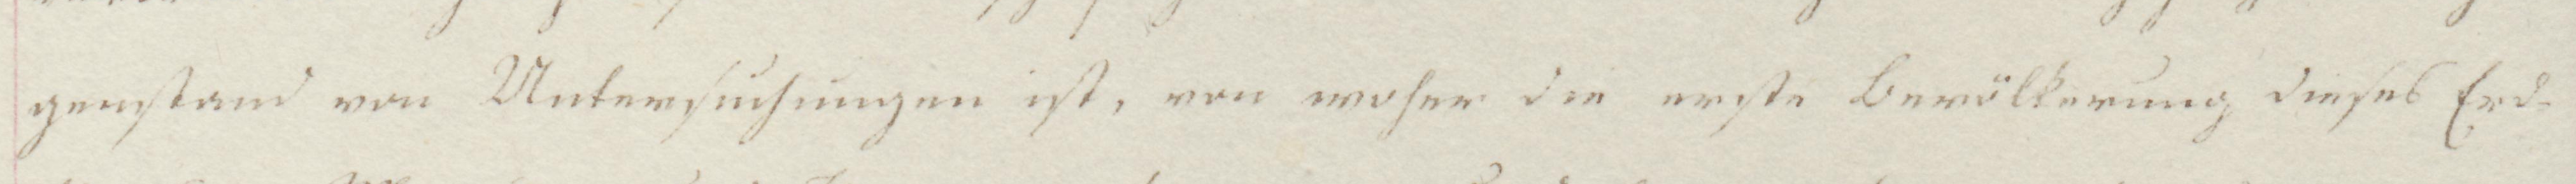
genstand von Untersuchungen ist, von woher die erste Bevölkerung dieses Erd-
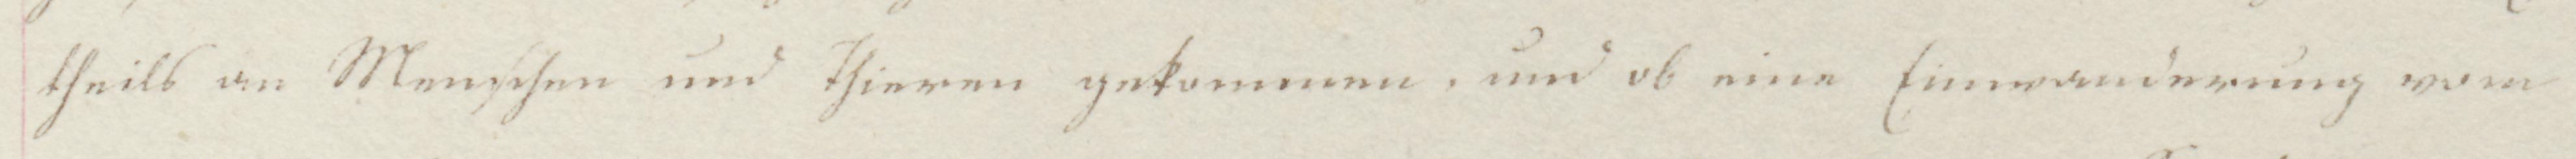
theils an Menschen und Thieren gekommen, und ob eine Einwanderung vom
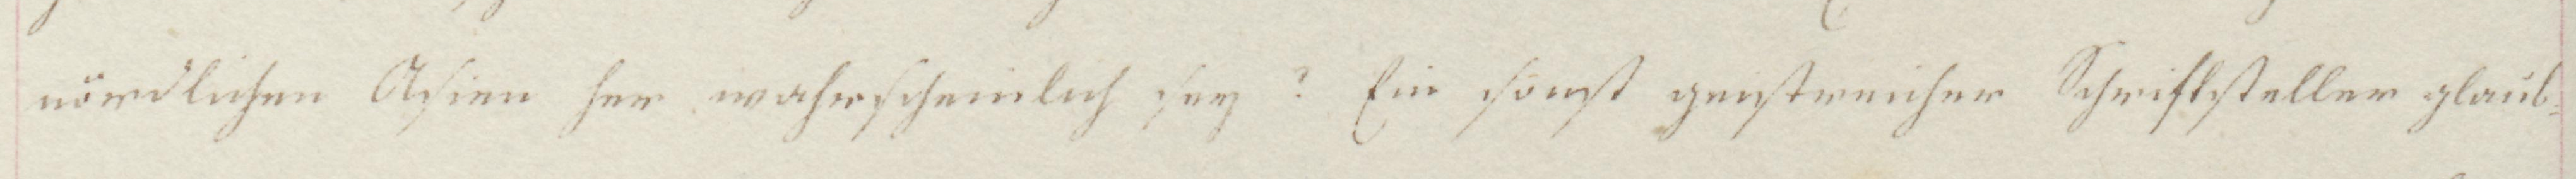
nördlichen Asien her wahrscheinlich sey? Ein sonst geistreicher Schriftsteller glaub-
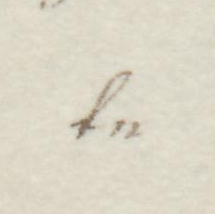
te
